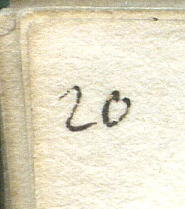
20
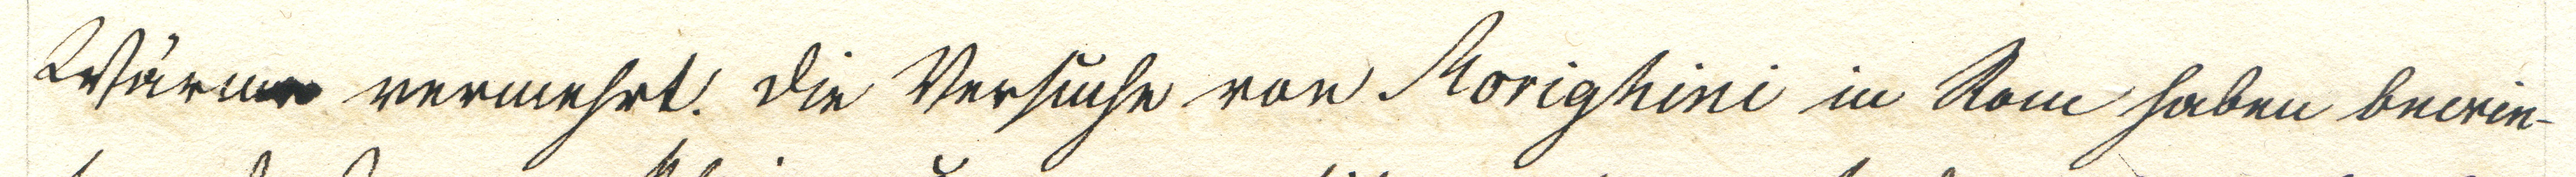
Wärm[e] vermehrt. Die Versuche von Morighini in Rom haben bewie-
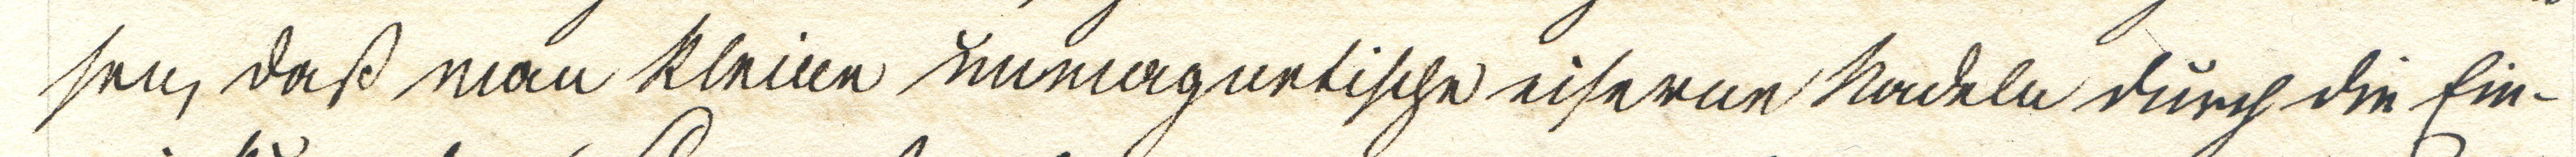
sen, daß man kleine unmagnetische eiserne Nadeln durch die Ein-
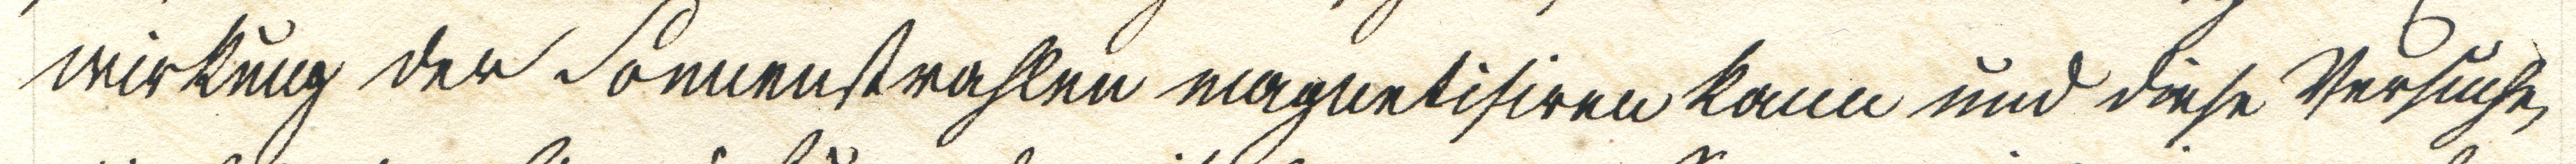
wirkung der Sonnenstrahlen magnetisiren kann und diese Versuche,
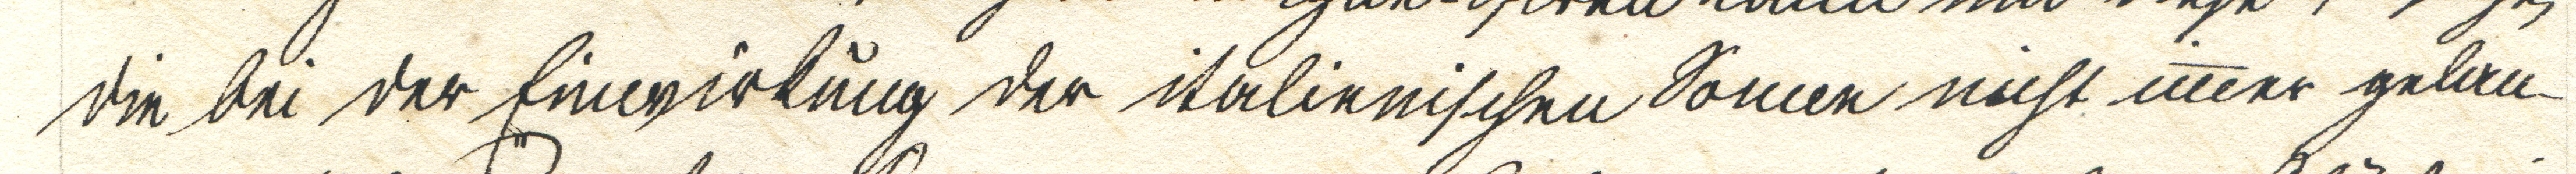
die bei der Einwirkung der italienischen Sonne nicht immer gelan-
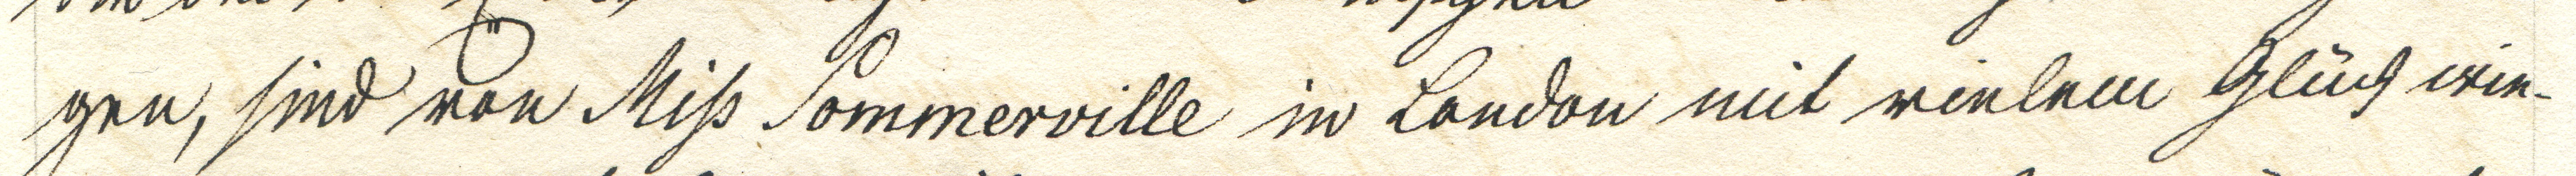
gen, sind von Miss Sommerville in London mit vielem Glück wie-
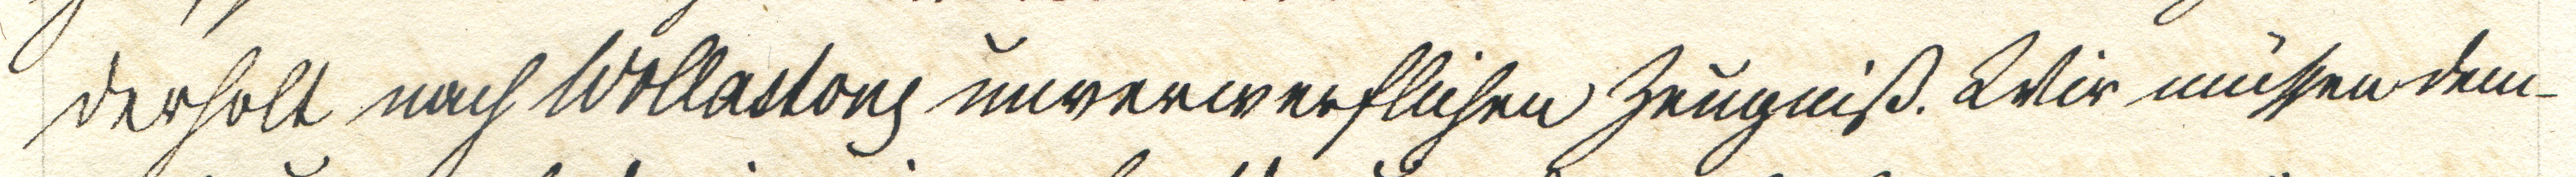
derholt nach Wollastons unverwerflichen Zeugniß. Wir müssen dem-
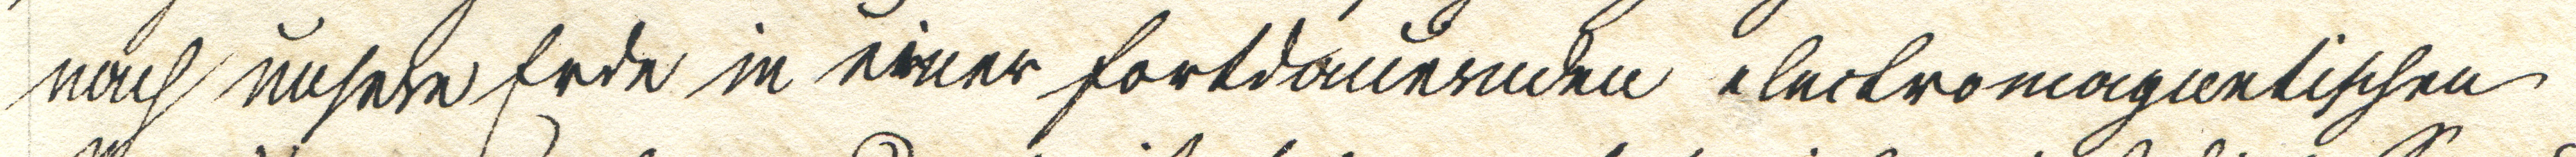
nach unsere Erde in einer fortdauernden electromagnetischen
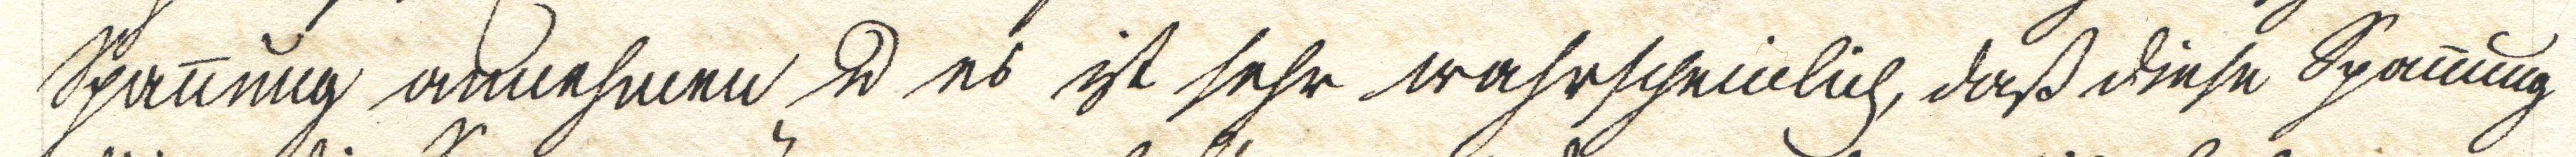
Spannung annehmen u es ist sehr wahrscheinlich, daß diese Spannung
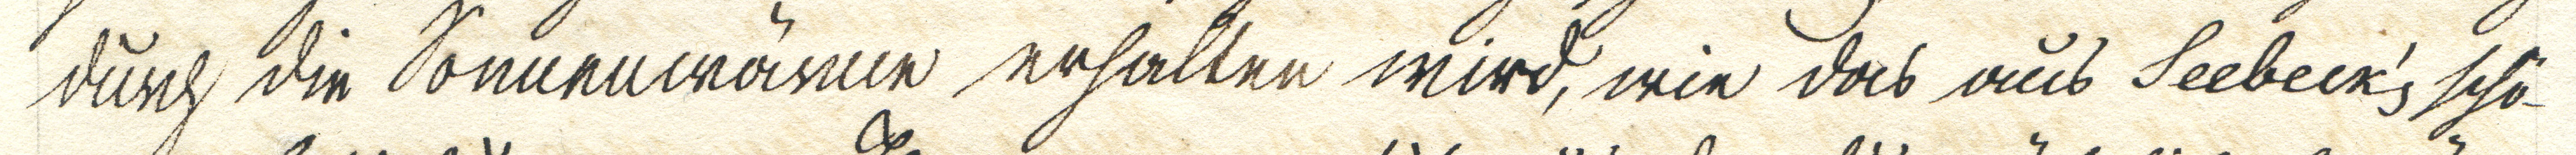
durch die Sonnenwärme erhalten wird, wie das aus Seebeck's schö-
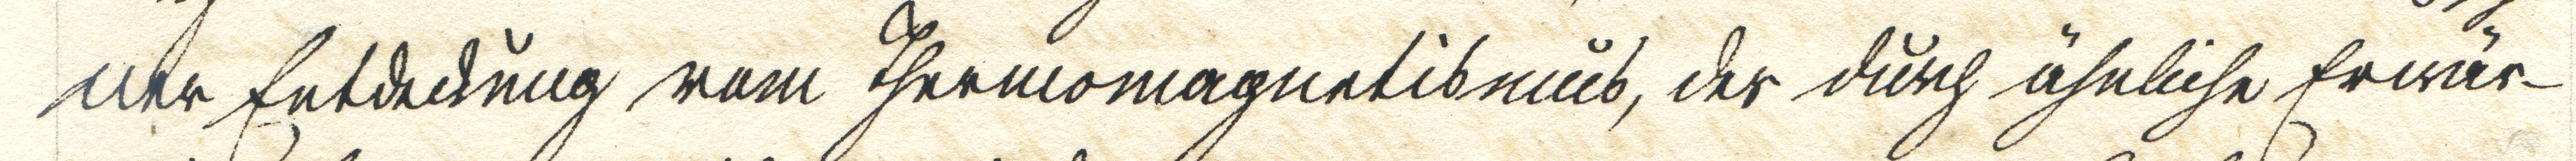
ner Entdeckung vom Thermomagnetismus, der durch ähnliche Erwär-
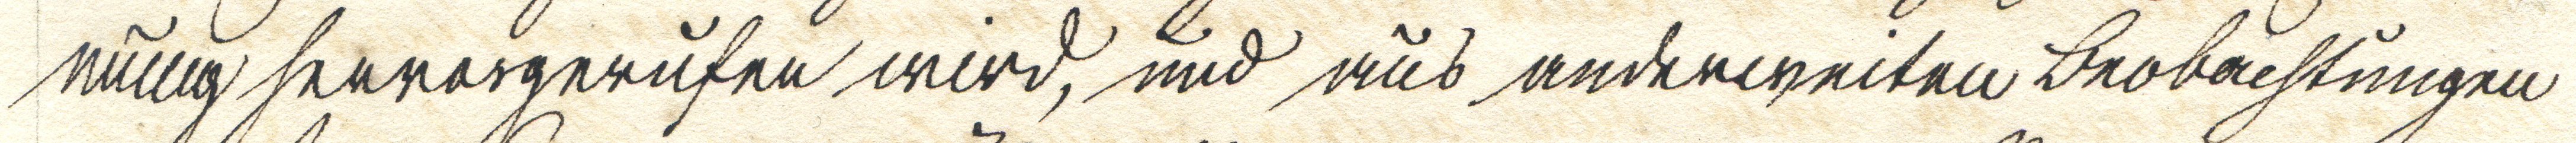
mung hervorgerufen wird, und aus anderweiten Beobachtungen
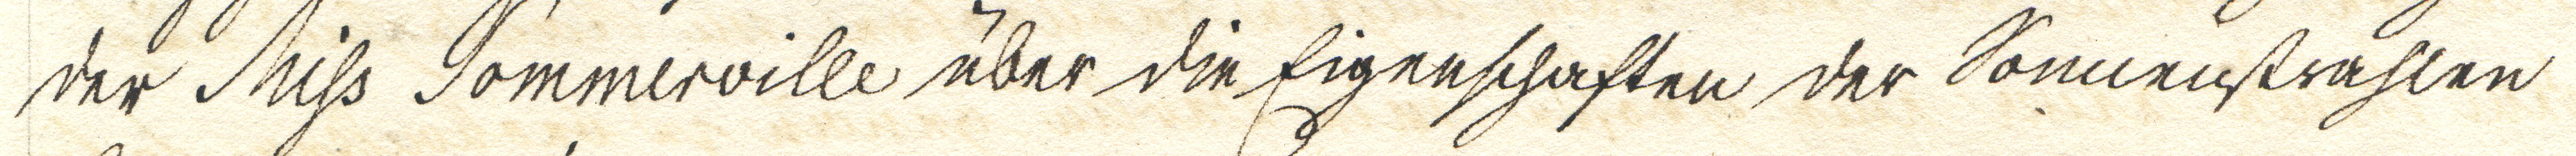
der Miss Sommerville über die Eigenschaften der Sonnenstrahlen
